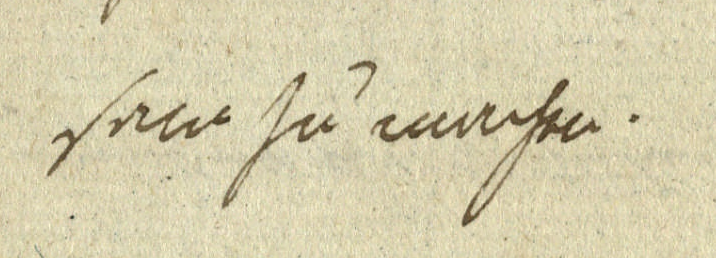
sam zu machen.
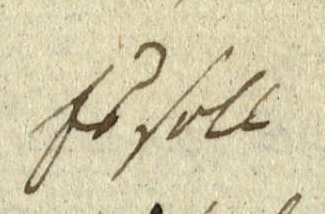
Es soll
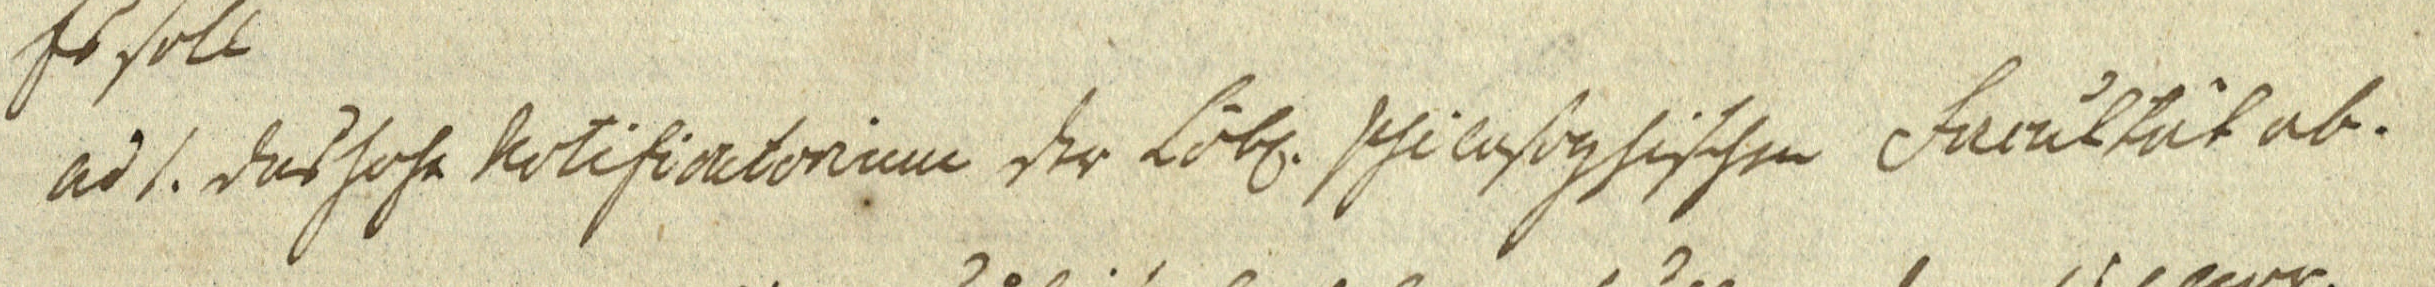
ad 1. das hohe Notificatorium der Löbl. Philosophischen Facultät ab¬
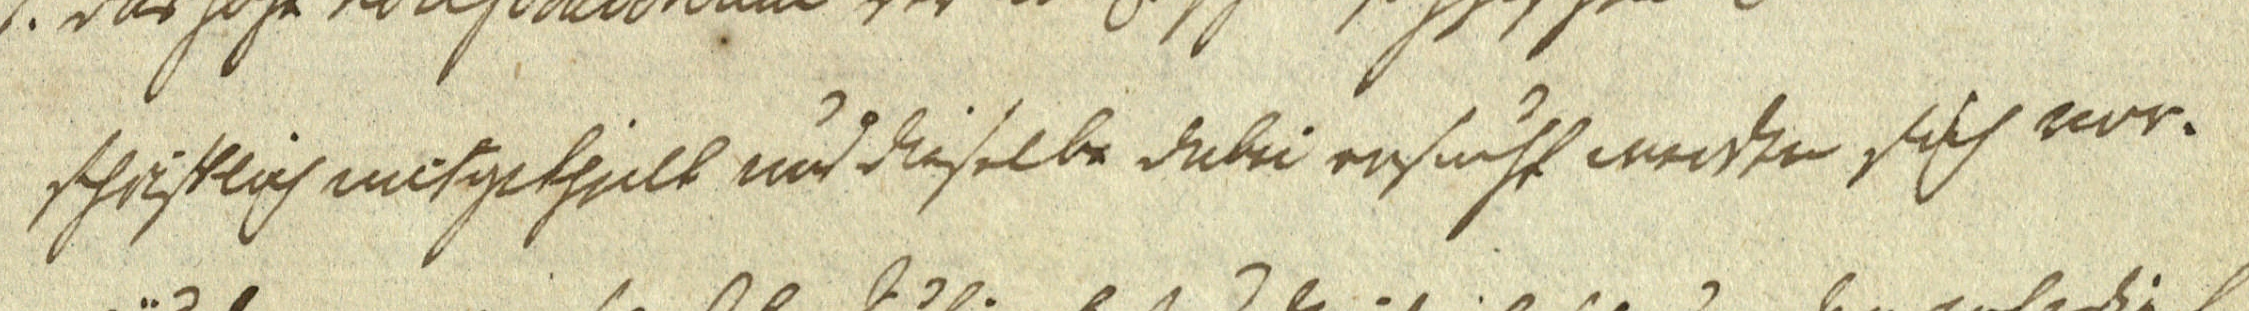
schriftlich mitgetheilt und dieselbe dabei ersucht werden sich vor¬
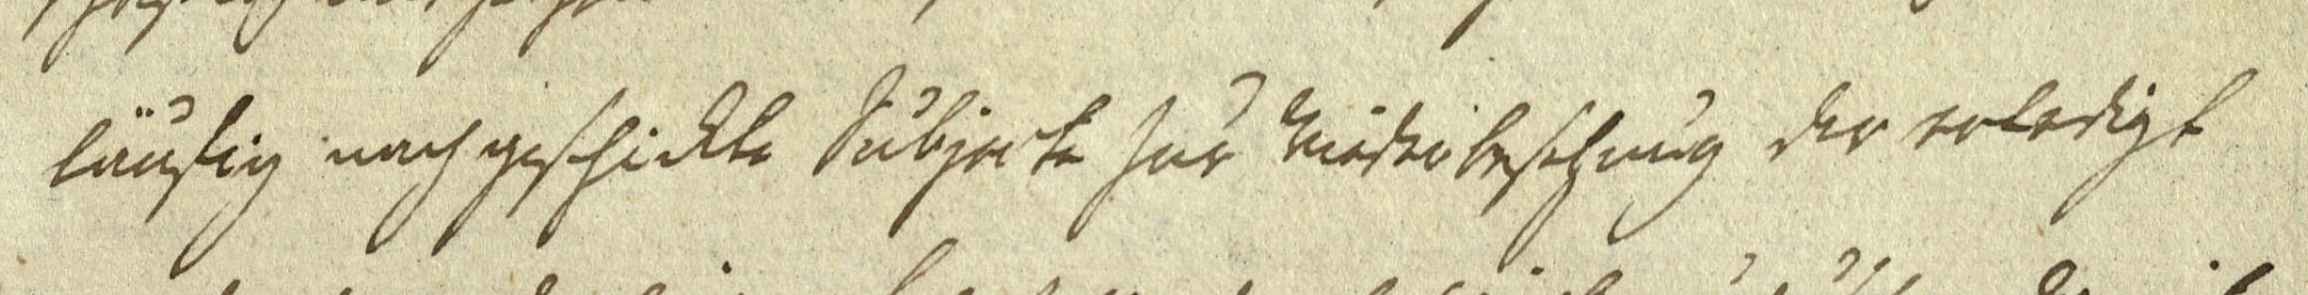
läufig nach geschickte Subjecte zur Wiederbesetzung der erledigt
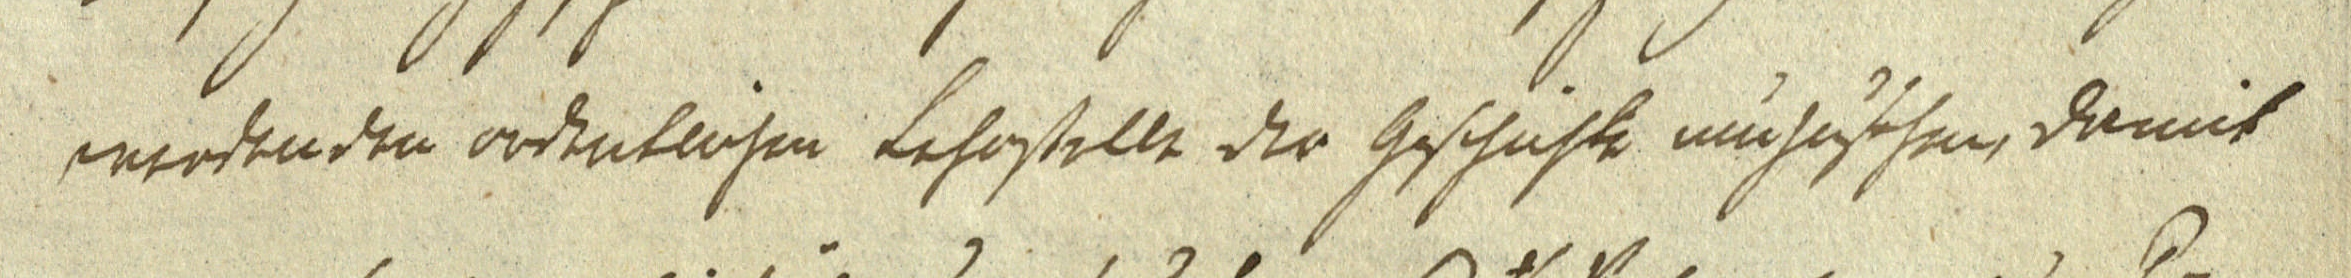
werdenden ordentlichen Lehrstelle der Geschichte umzusehen, damit
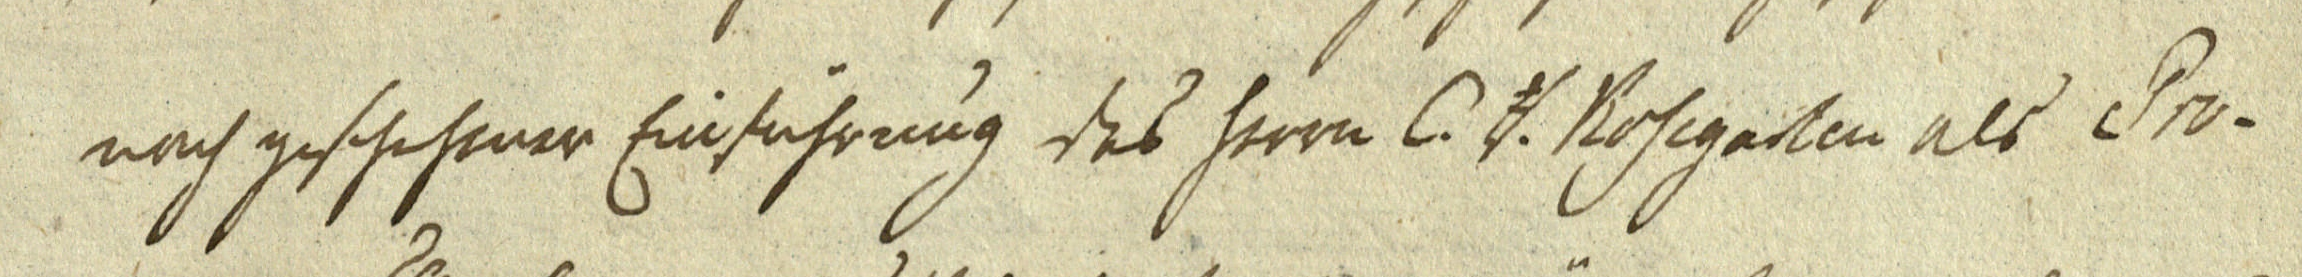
nach geschehener Einführung des Herrn C. R. Kosegarten als Pro¬
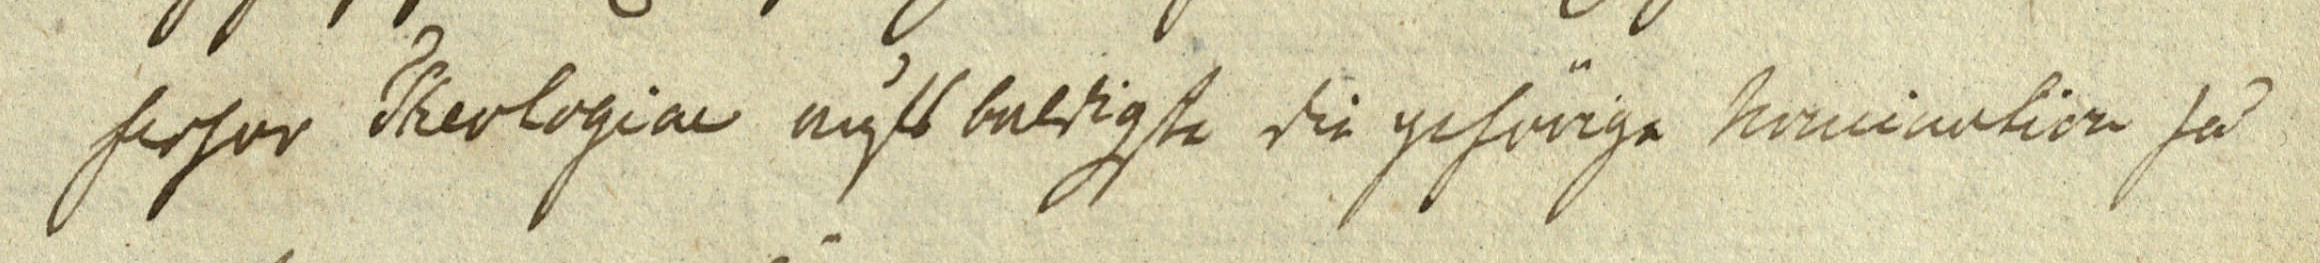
fessor Theologiae aufs baldigste die gehörige Nomination zu
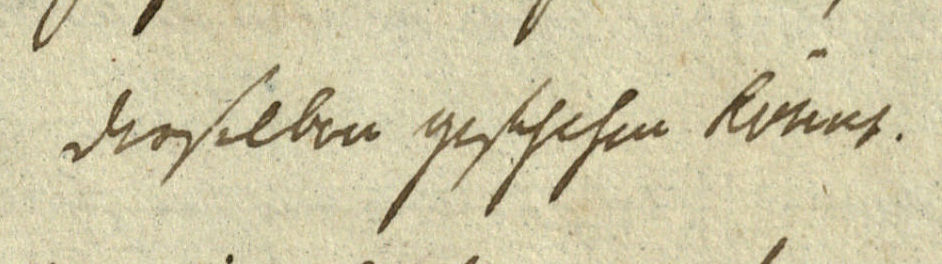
derselben geschehen könne.
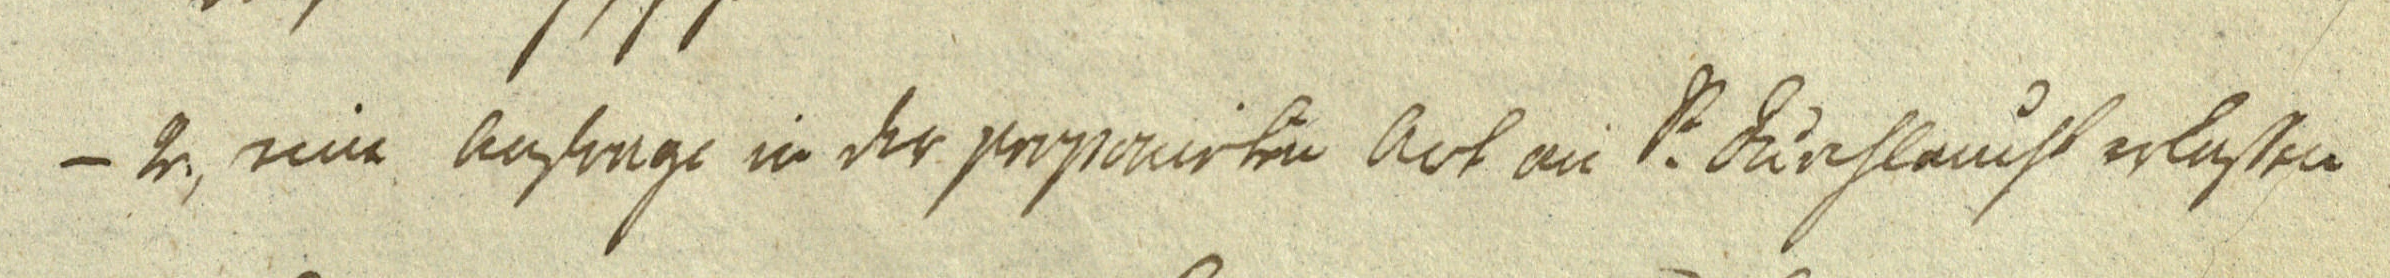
2., eine Anfrage in der proponirten Art an Sr. Durchlaucht erlassen
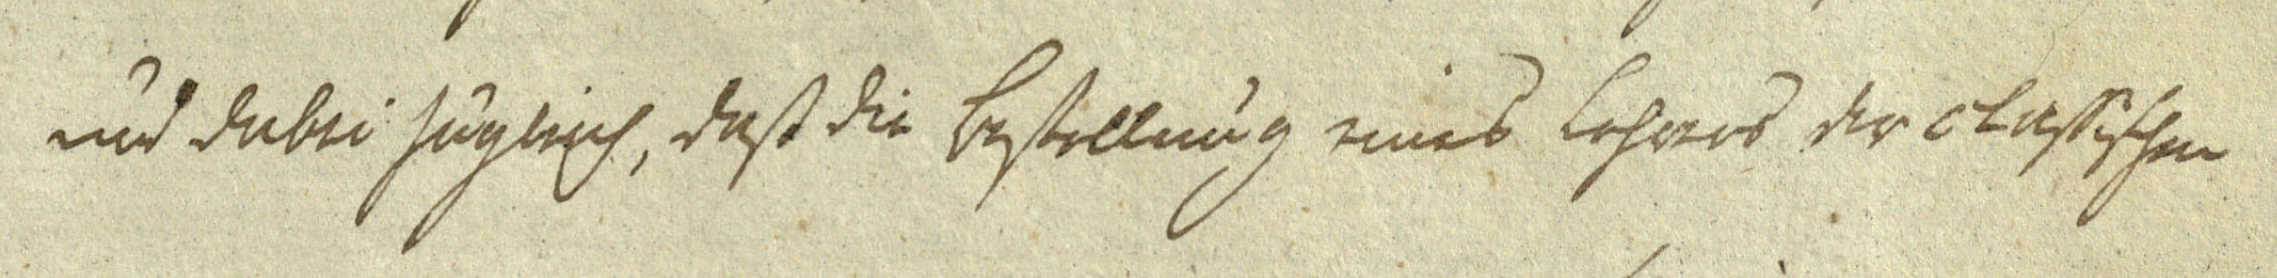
und dabei zugleich, daß die Bestellung eines Lehrer der classischen
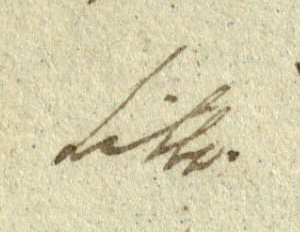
Litte¬
